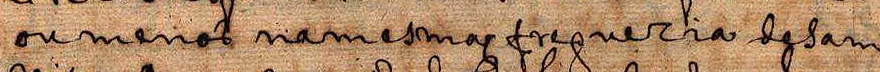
ou menos na mesma freguezia de sam
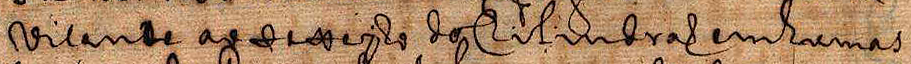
Vicente ao teRejro do Chilindraõ em humas
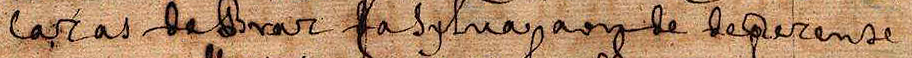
cazas de Braz da Sylua aonde de prezente
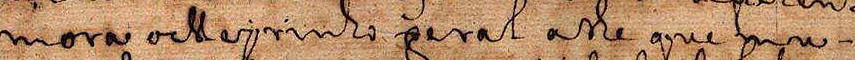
mora o Mejrinho geral athe que mu
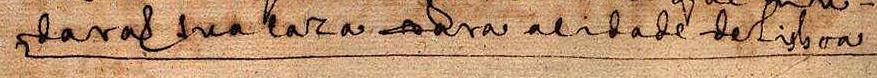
daraõ sua caza para a cidade de Lisboa
